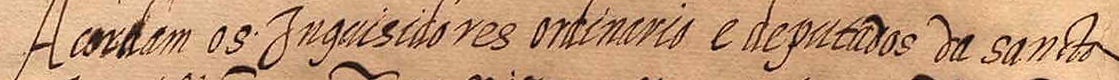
Acordam os Jnquisidores ordinario e deputados da sancta
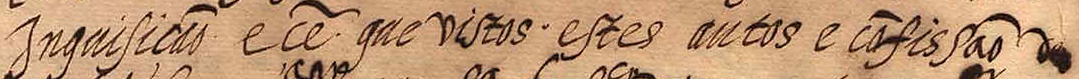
Jnquisição e cē que vistos estes autos e cōfissão de
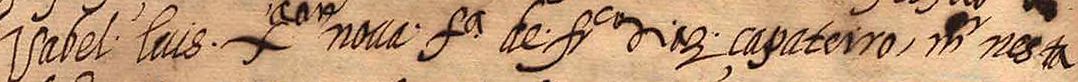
Jsabel luis xaam noua fa de frco diaz çapateiro, mor nesta
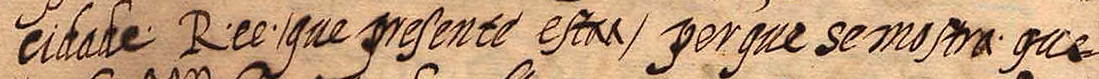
cidade Ree / que presente estaa / per que se mostra que
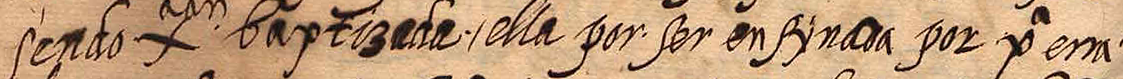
sendo xaam baptizada / ella por ser ensynada por pa erra
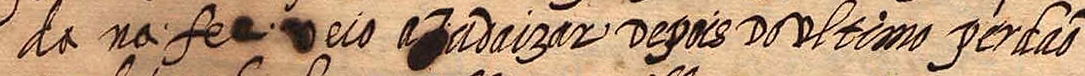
da na fee veio a Judaizar Depois Do vltimo perdaõ
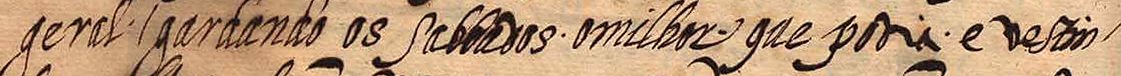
geral / gardando os sabbados o milhor que podia e vestin
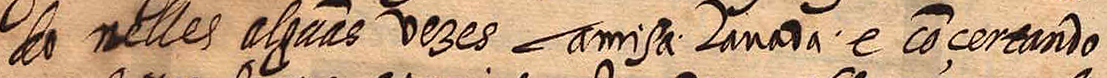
do nelles algūas vezes camisa lauada e cōcertando
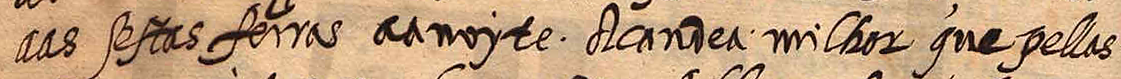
aas sestas ferras aa noyte A candea milhor que pellas
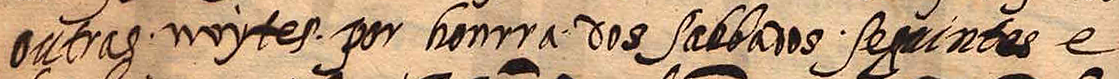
outras noytes por honrra dos sabbados seguintes e
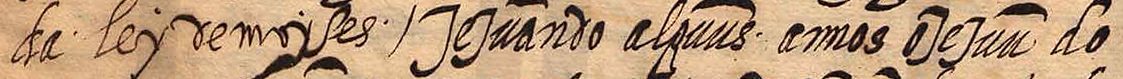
da ley de moyses / JeJūando algūus annos o JeJūu do
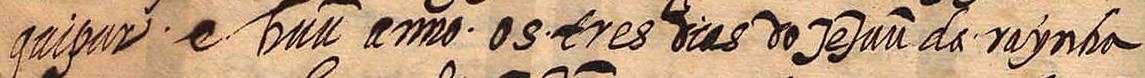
quipur e hūu anno os tres dias do JeJūu da raynha
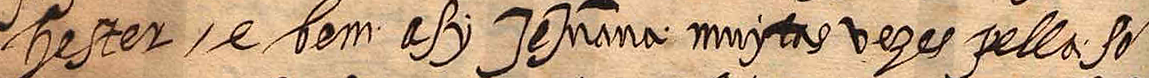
hester / e bem asy JeJūaua muytas vezes pella so
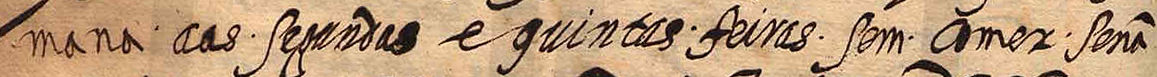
mana aas segundas e quintas feiras sem comer senā
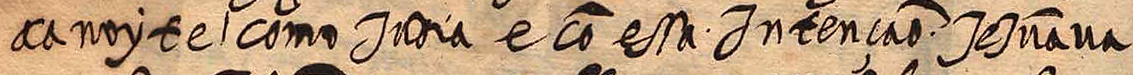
aa noyte / como Judia e cō essa Jntenção JeJūaua
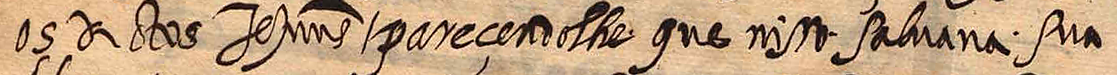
os dictos Jejūus / parecendolhe que nisso saluaua sua
